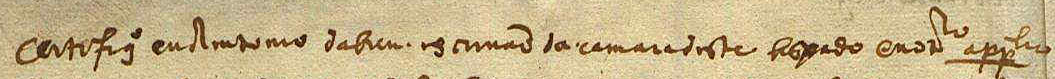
certifiqo eu Amtonio dabreu escriuão da camara deste bispado e notro applico
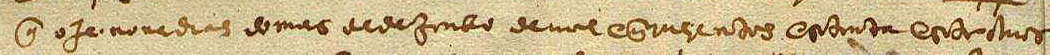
q̄ oJe noue dias do mes de dezenbro de mil e q̄jnhentos e setenta e sete Anos
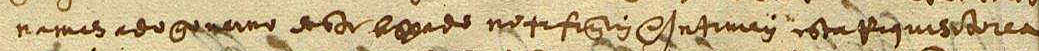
na mesa do gouerno deste bispado notifiq̄ey e Jntimey esta Requisitorea
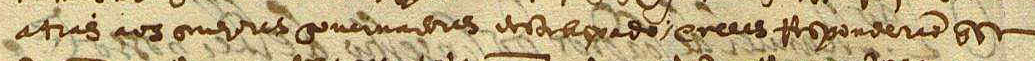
atras aos senhores gouernadores deste bispado / e elles Responderão q̄ se
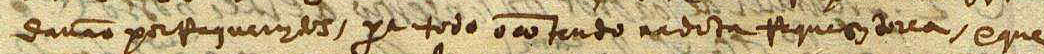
dauão por Requerydos / ꝑa todo o c̄oteudo na dita Requisytorea / e que
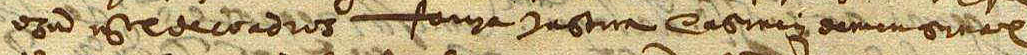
o sōr mel de coadros farya Justiça e asiney de meu sinal
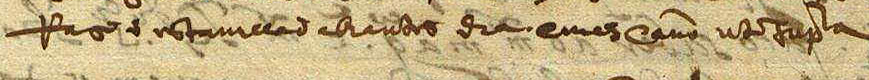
Raso ē esta uilla d̄ abrantes dia e mes e āno ut supra
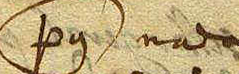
pḡ nada
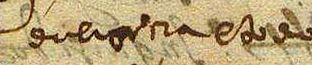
deligēcia e todo
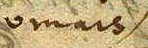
o mais /
